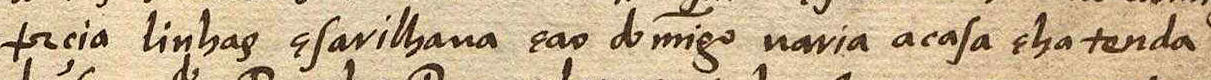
torçia linhas E sarilhaua E ao dom̄igo uaria a casa E ha tenda
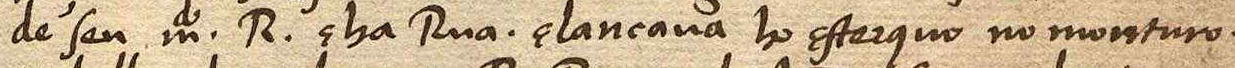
de seu mdo. R. E a Rua. E lancaua ho Esterquo no monturo.
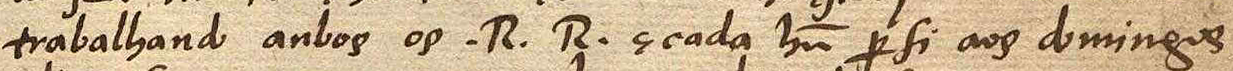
trabalhando anbos os .R. R. E cada hū ꝑ si aos domingos
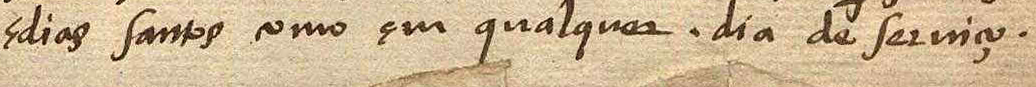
E dias santos como Em qualquer . dia de seruiço.
